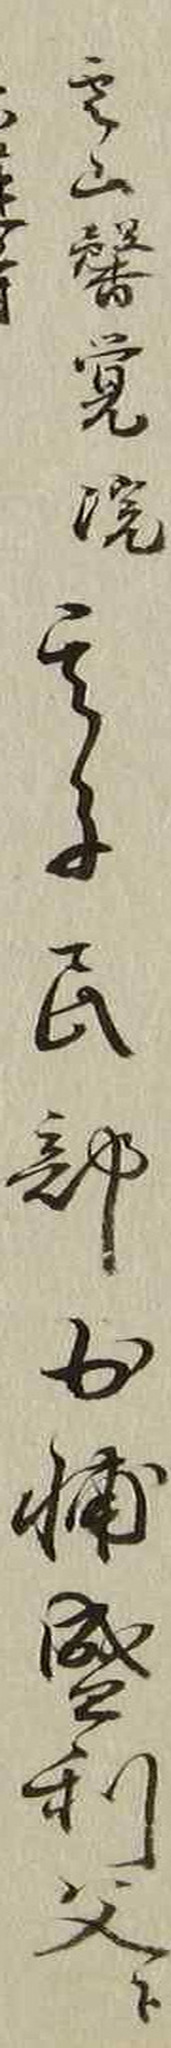乗蓮寺其子民部少輔盛利父ト
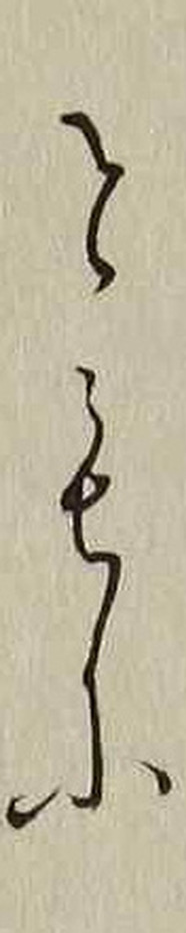ともに
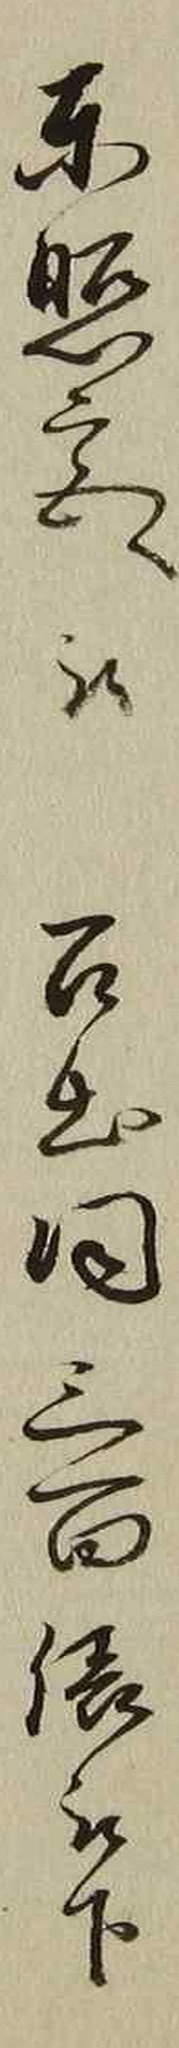東照宮へ被召出同三百俵被下
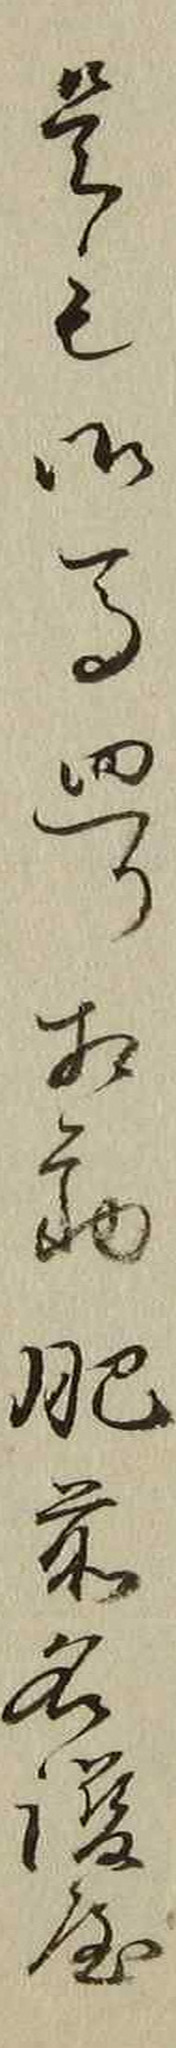是も御馬廻り相勤肥前名護屋
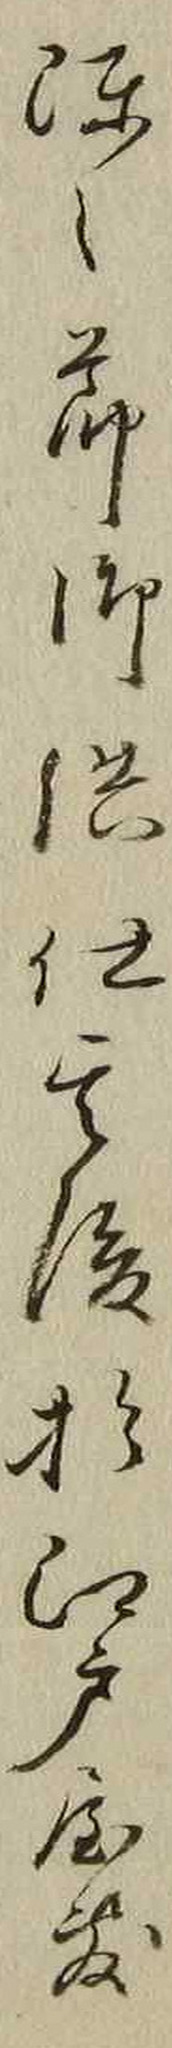陣之節御供仕其後於江戸屋敷
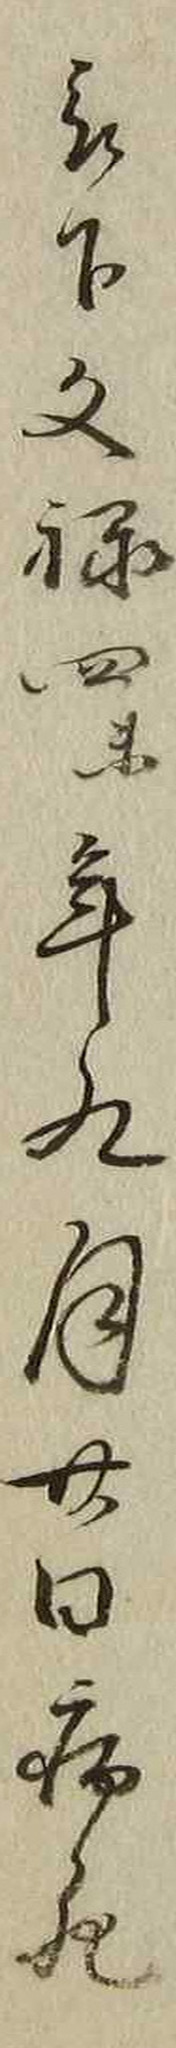被下文禄四未年九月廿日病死
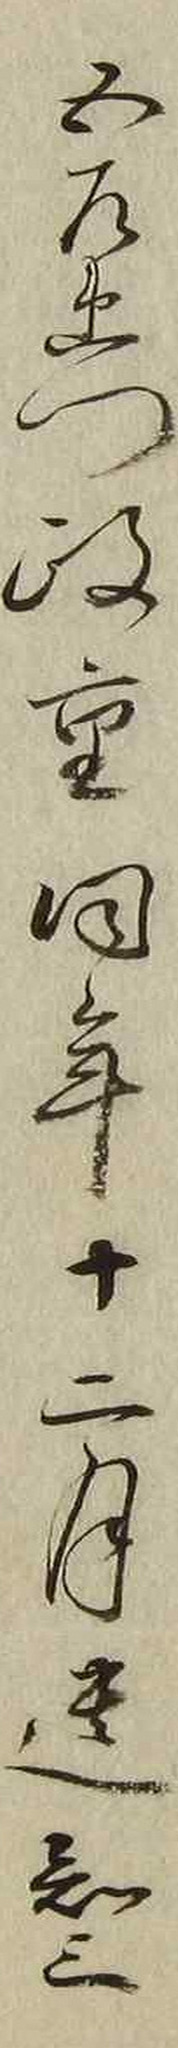五左衛門政重同年十二月遺知三
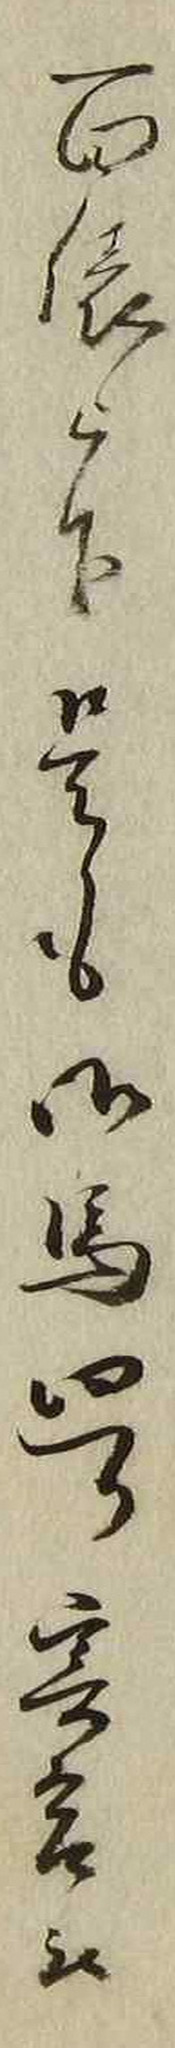百俵被下是も御馬廻り寄合被
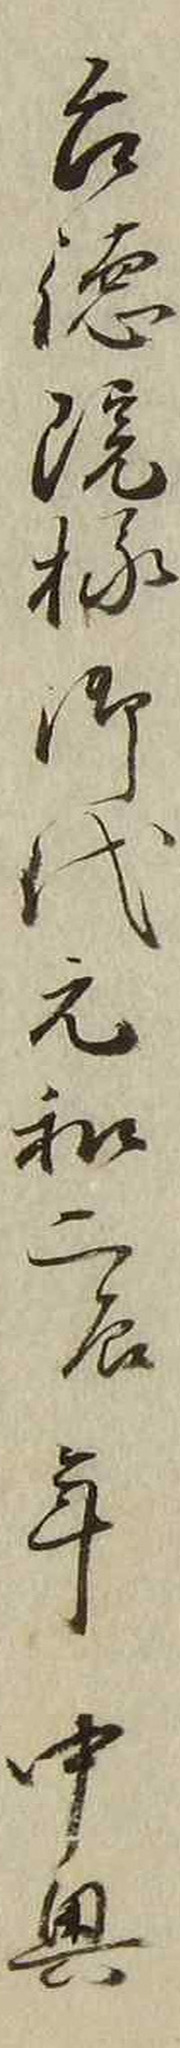台徳院様御代元和二辰年中奥
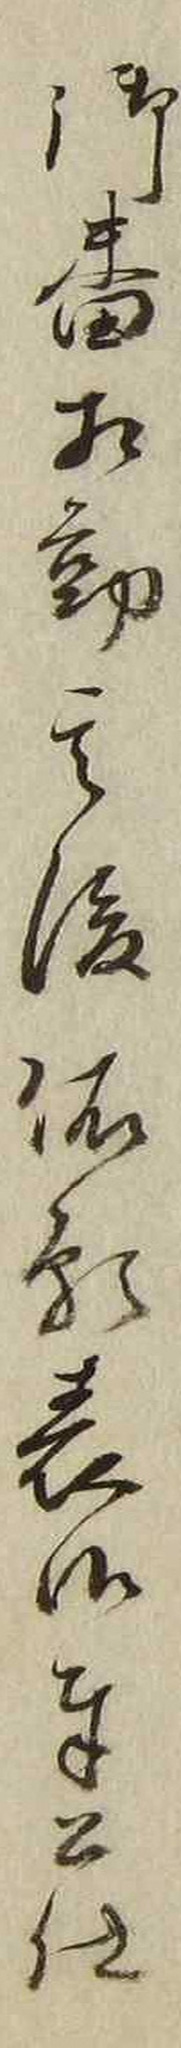御番相勤其後依願表御奉公仕

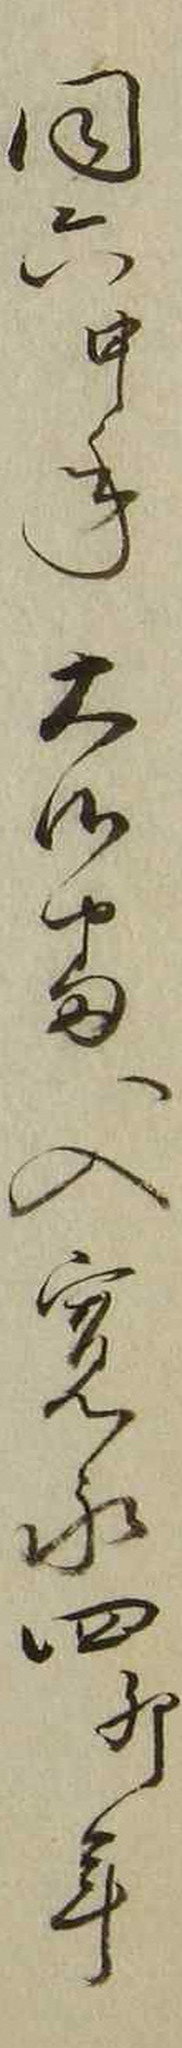同六申年大御番へ入寛永四卯年
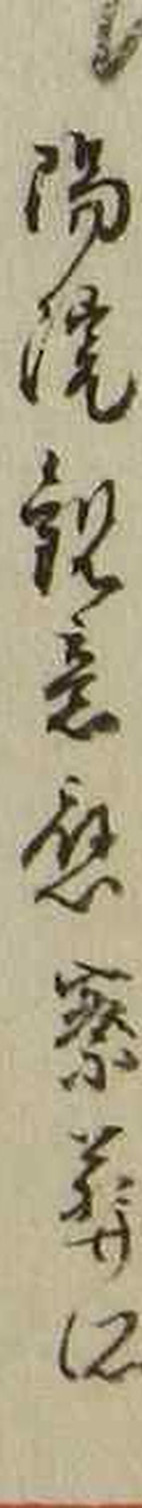陽院観意応察葬所
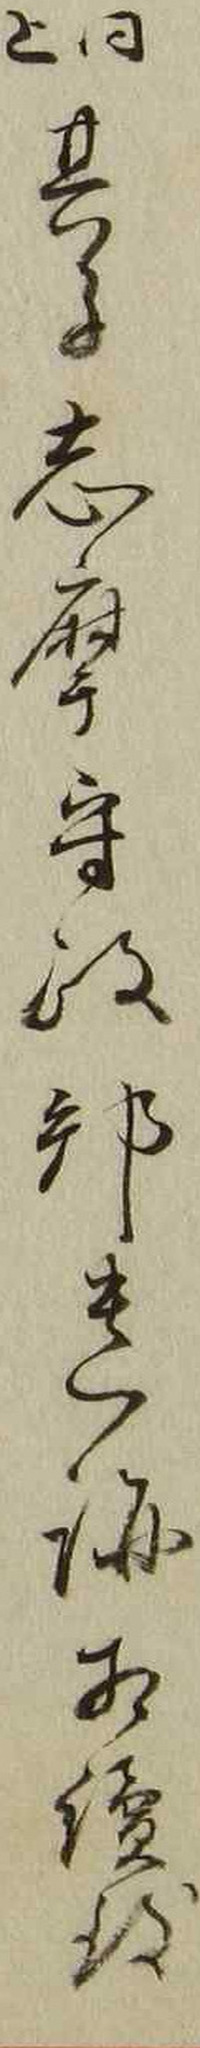上其子志摩守政邦遺跡相続致
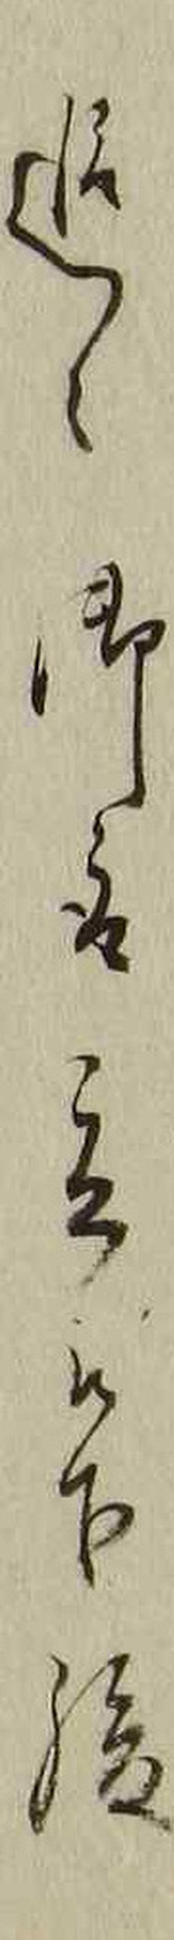追々御取立被下後
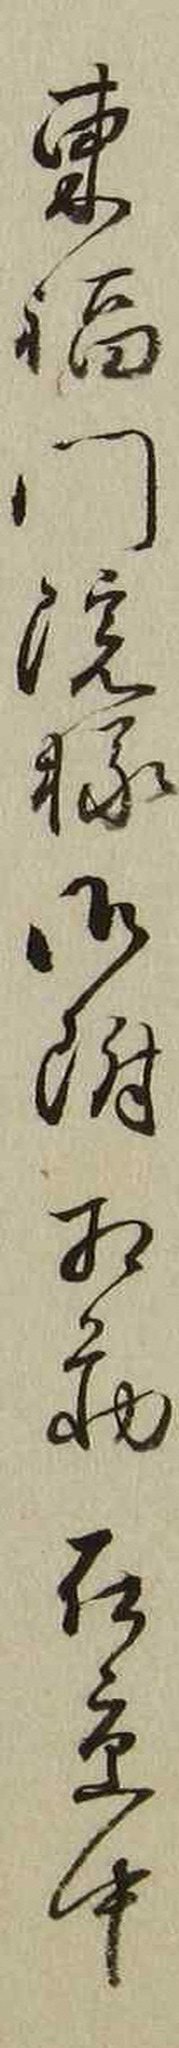東福門院様御附相勤在京中
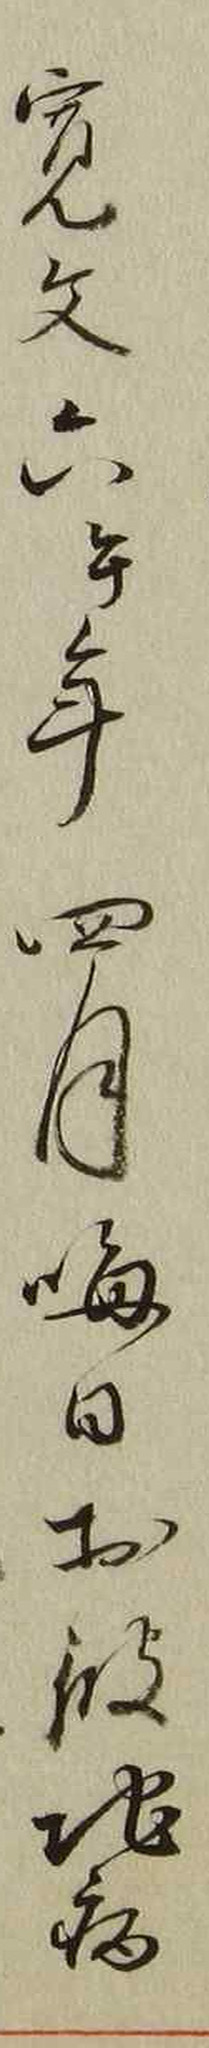寛文六午年四月晦日於彼地病
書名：諸士系譜　巻之4　い之部4
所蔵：会津若松市立会津図書館
